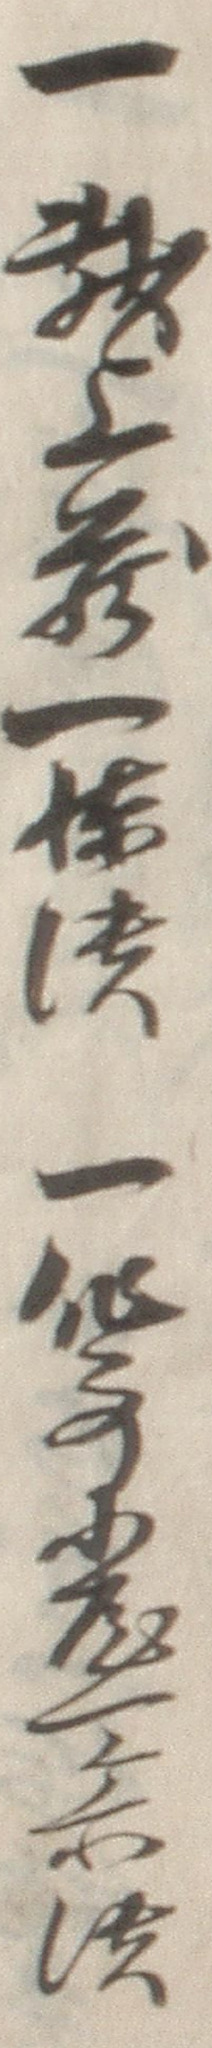一献上蔵一棟潰一作事小屋一ヶ所潰
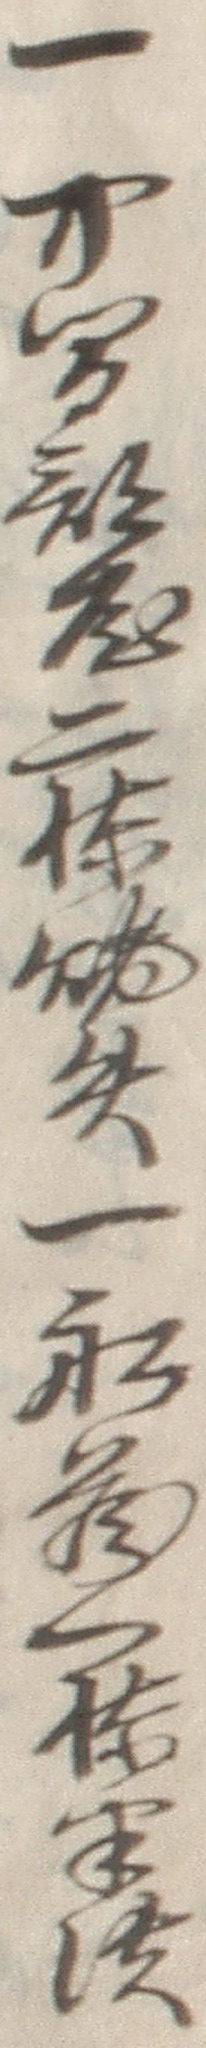一中間部屋二棟焼失一船蔵一棟半潰
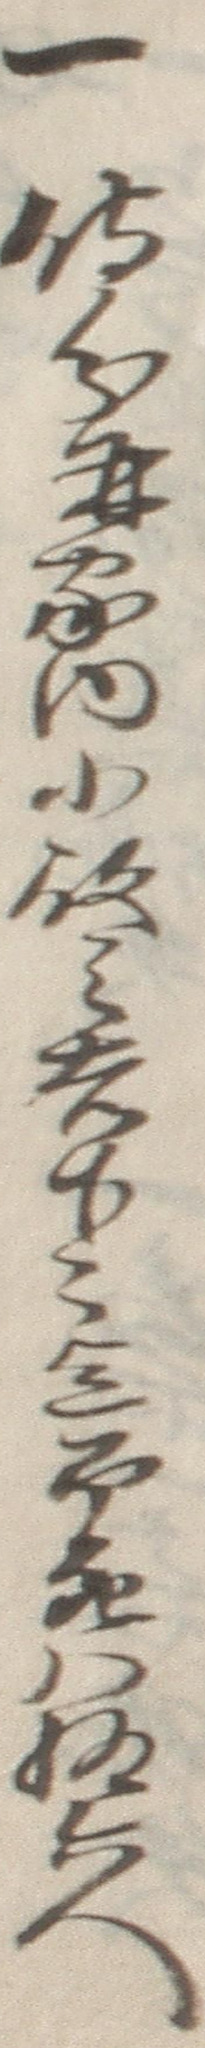一侍分并家内小役之者下々迄即死八拾六人
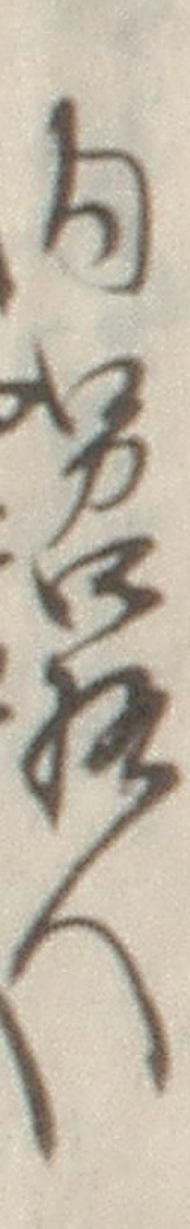内男四拾人
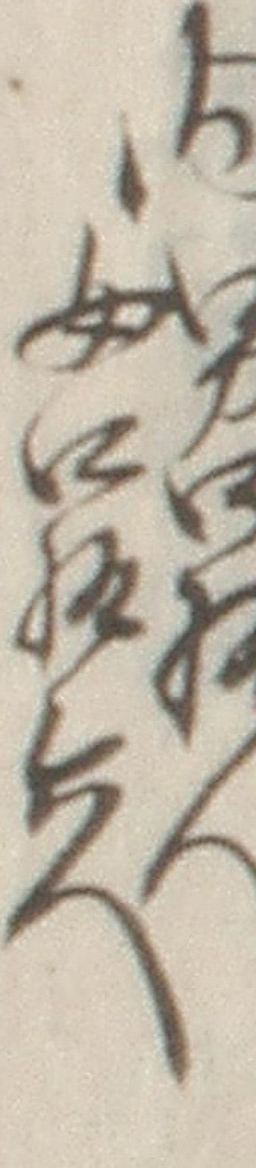女四拾六人

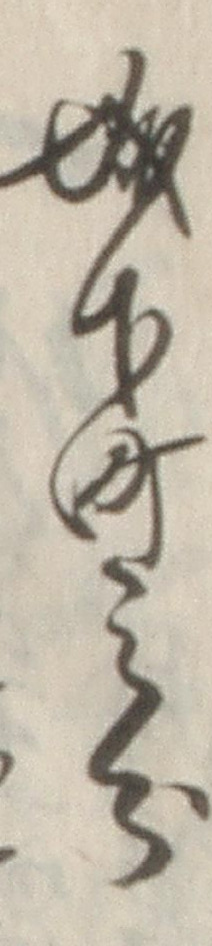城下町之分
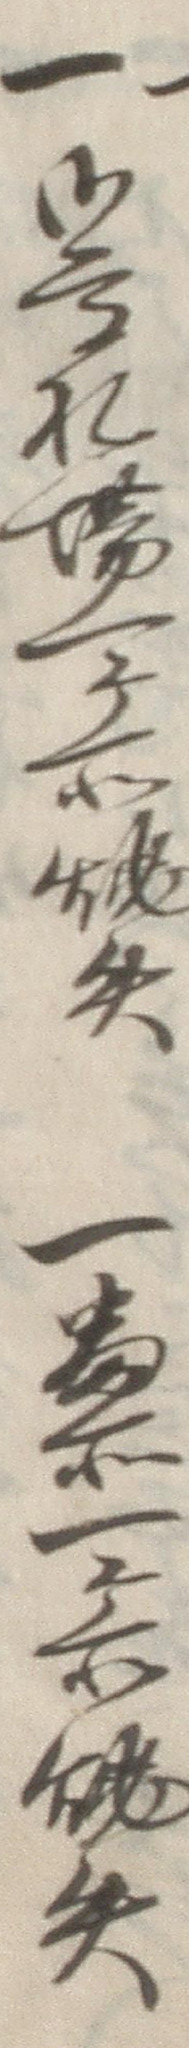一御高札場一ヶ所焼失一番所一ヶ所焼失
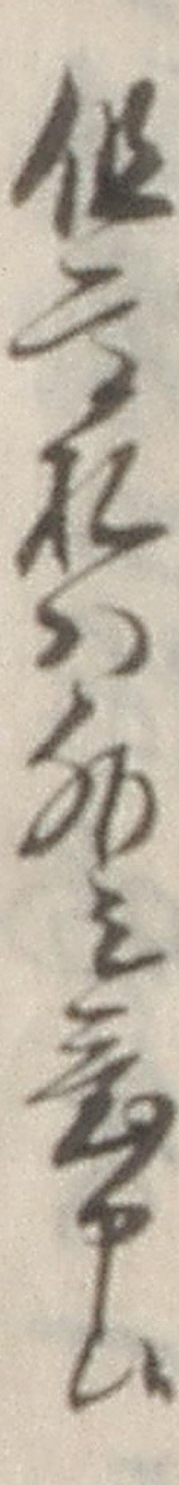但高札ハ外ㇱ置申候
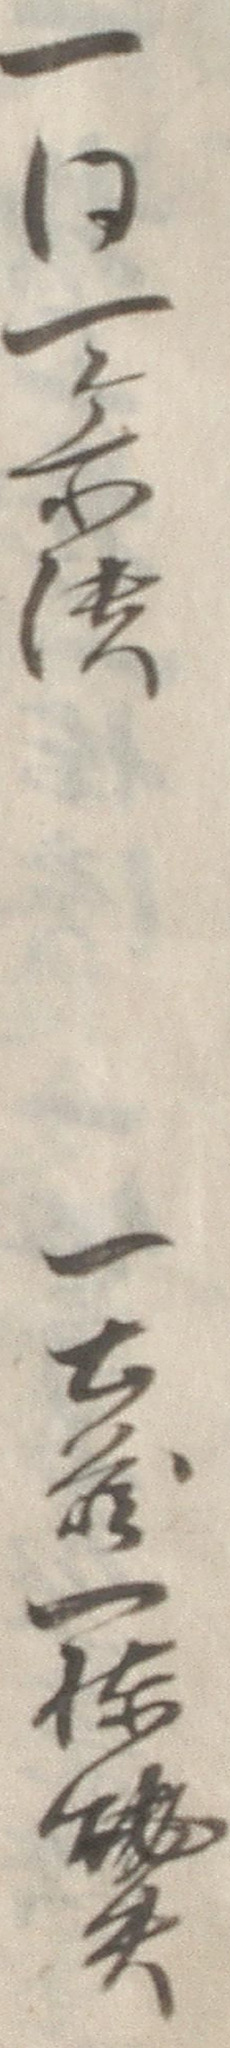一同一ヶ所潰一土蔵一棟焼失
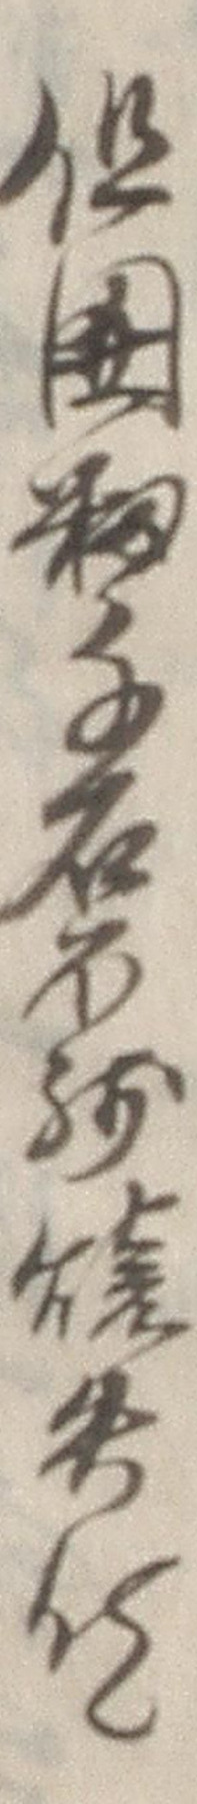但囲籾子千石不残焼失仕候
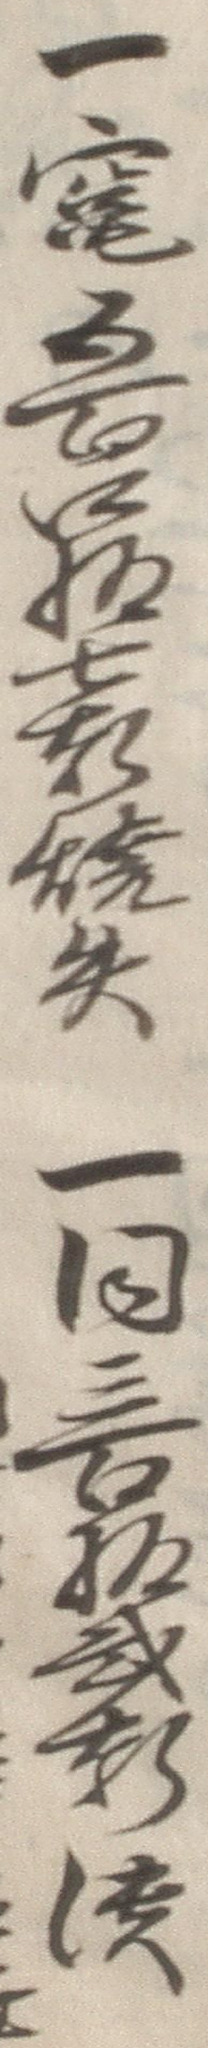一竈五百四拾七軒焼失一同三百拾弐軒潰
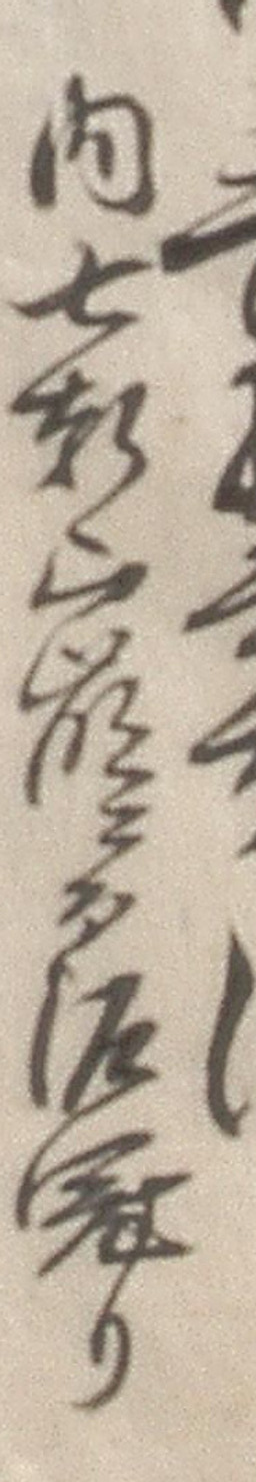内七軒山崩二而泥冠り
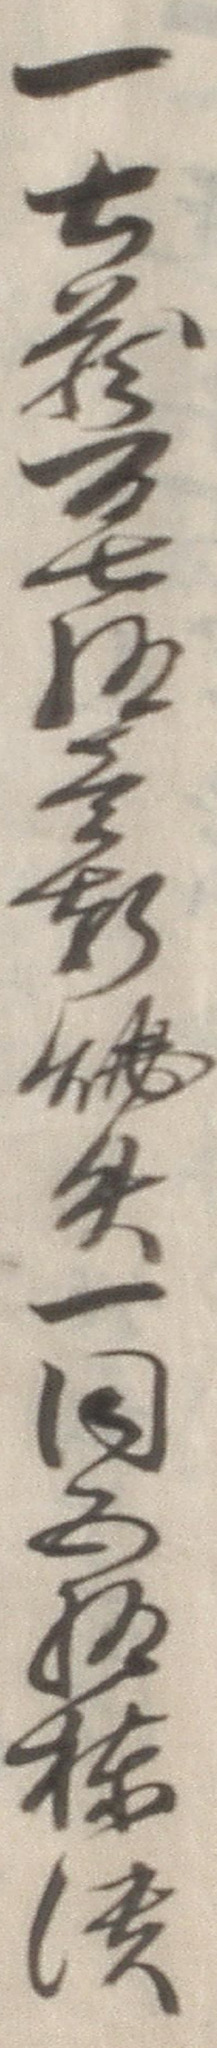一土蔵百七拾壱軒焼失一同五拾棟潰
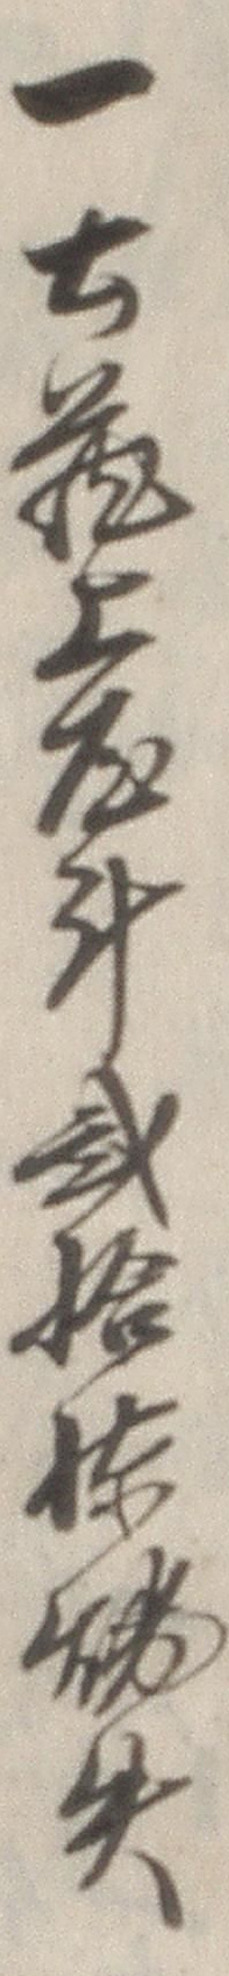一土蔵上屋計弐拾棟焼失
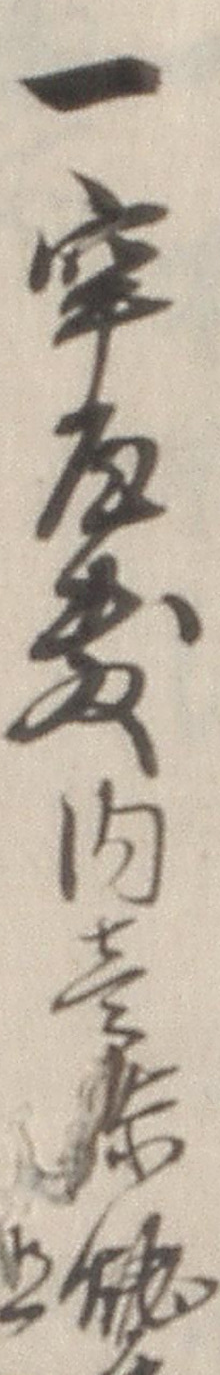一牢屋敷内壱棟焼失
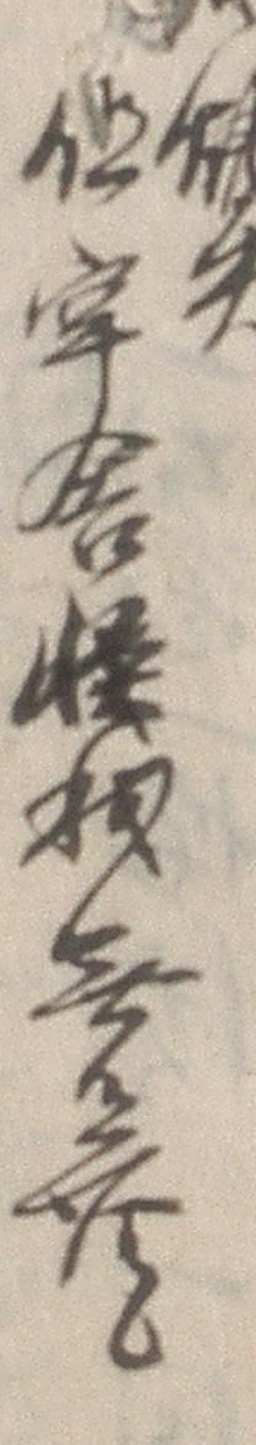但牢舎怪我無御座候
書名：信州地震一件
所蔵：東京大学地震研究所図書室 Earthquake Research Institute Library, The University of Tokyo, JAPAN
